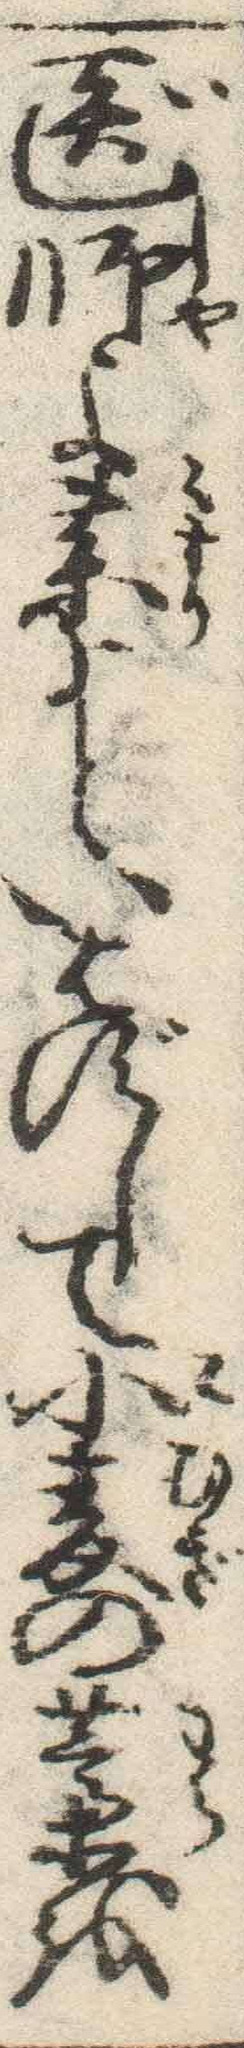医師よ薬よといはずして小麦の藁を
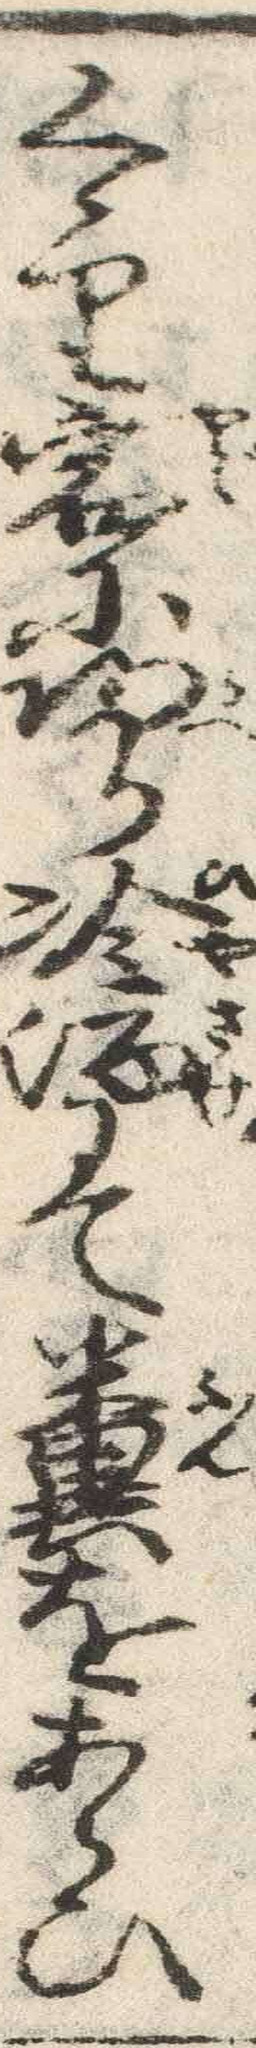くゝり宿に帰り冷酒にて糞をあらひ
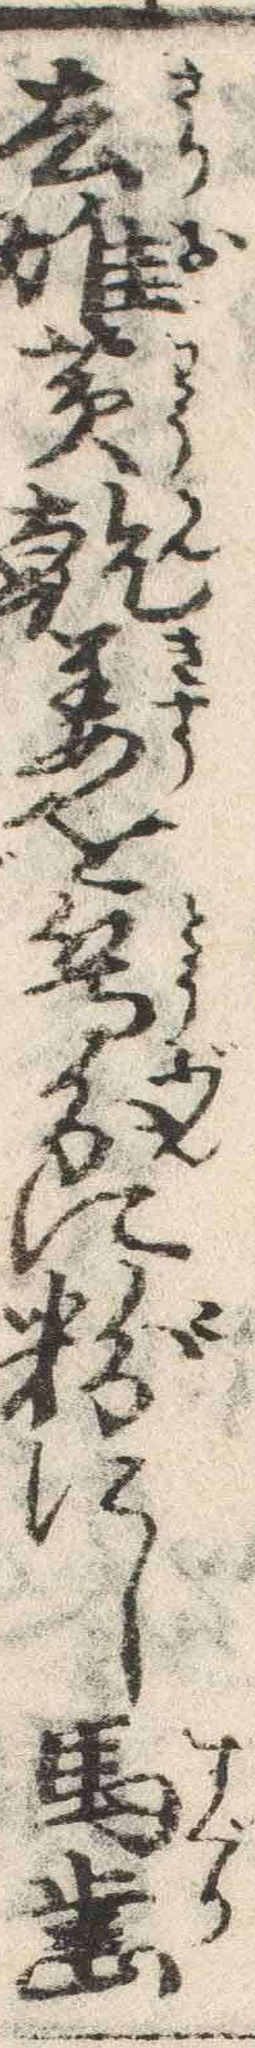去雄黄乾姜を等分に粉にし馬歯
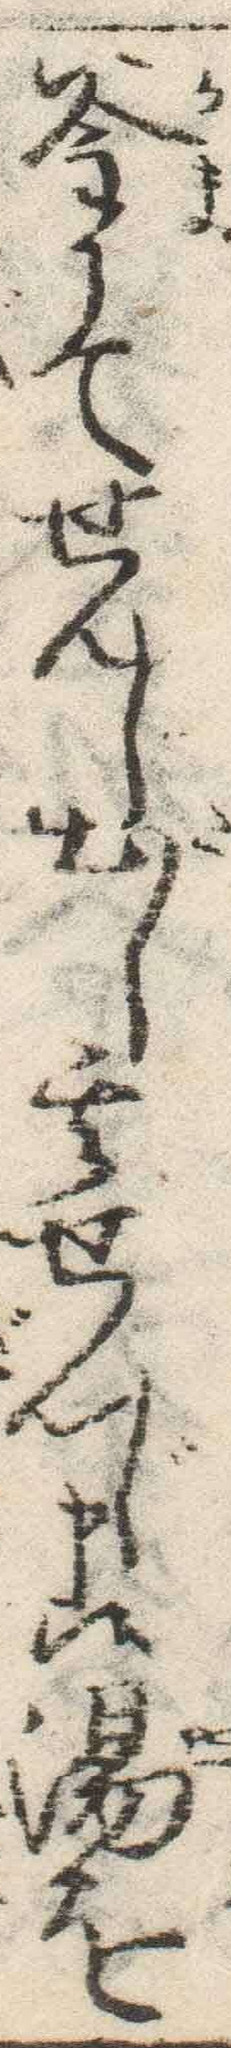釜にてせんじ出し其せんじ申候湯を
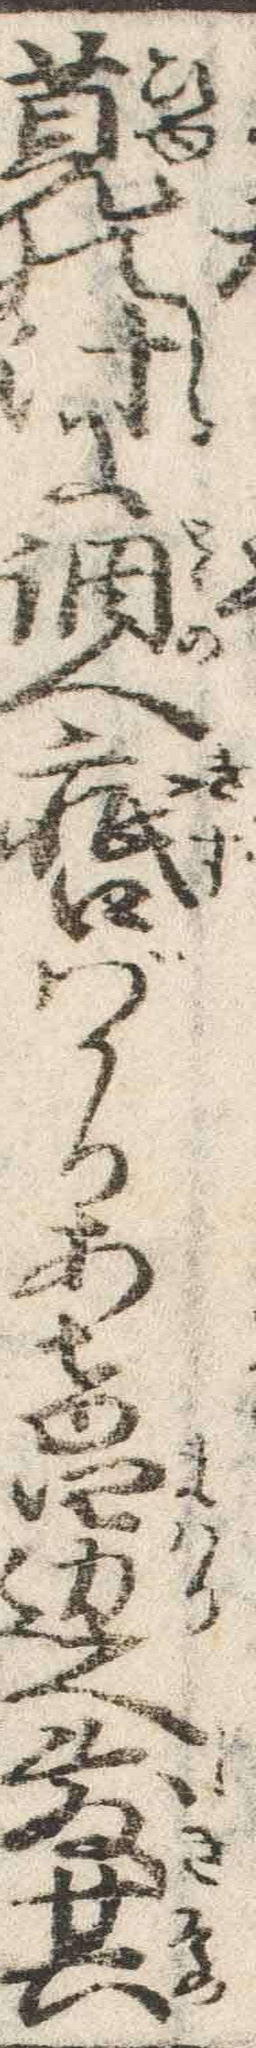莧の汁に調へ疵口ばかりあけ四辺へ敷其
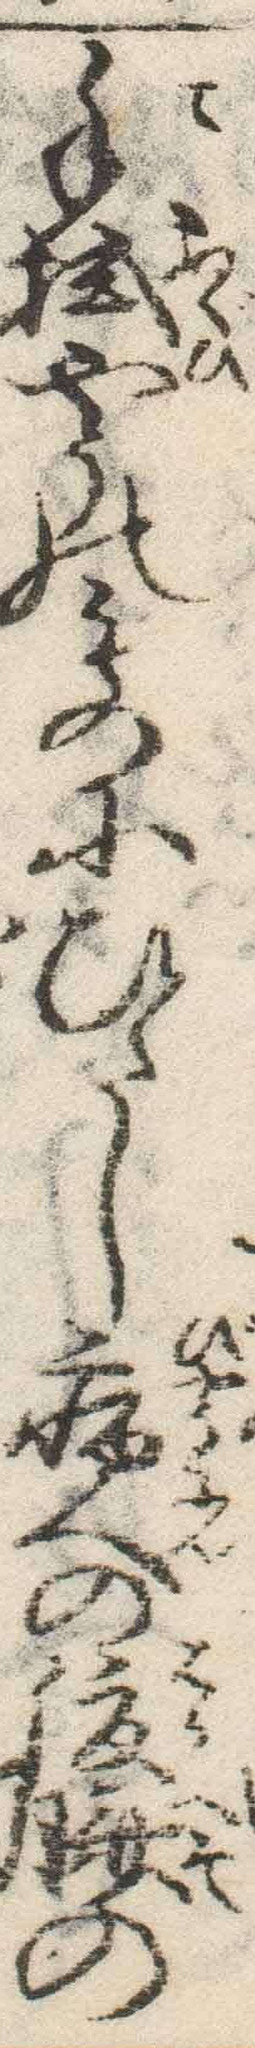手拭やうのものにひたし病人の腹臍の
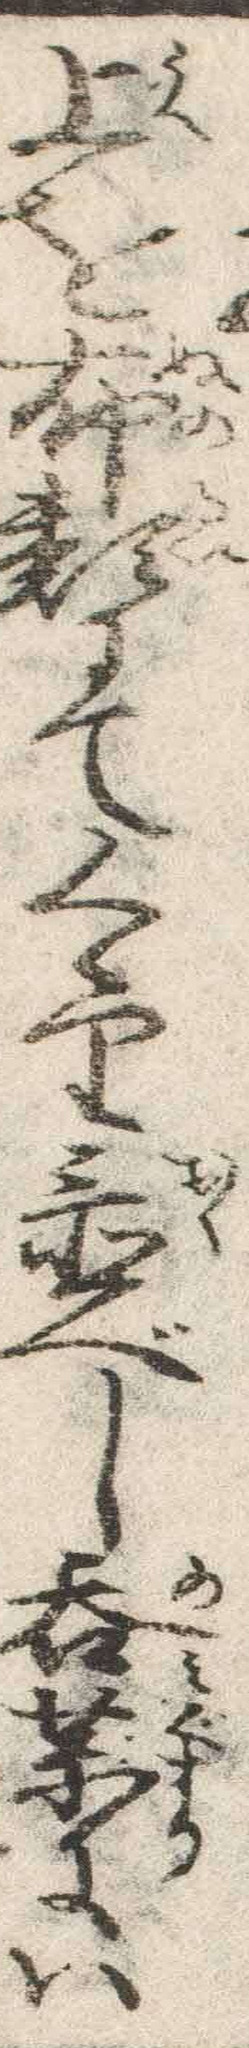上を布類にてくゝり置べし呑薬には
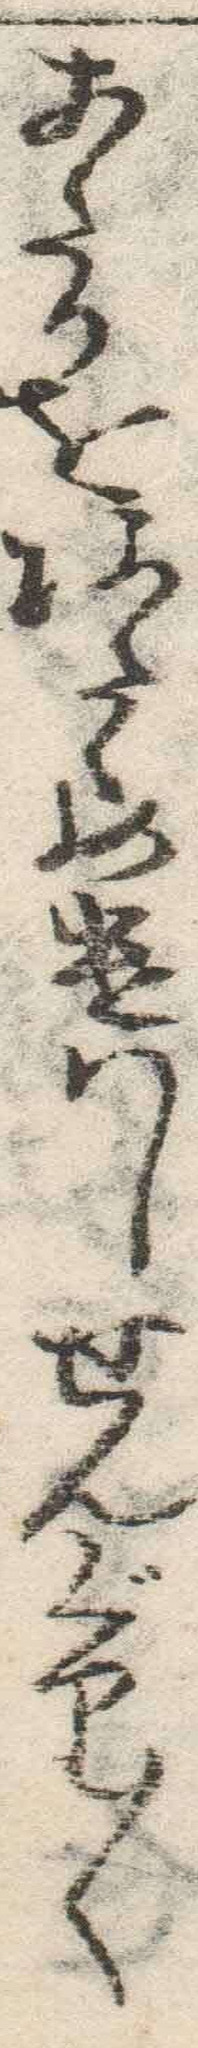あたりをあたゝめ遣はしせんぐり〳〵
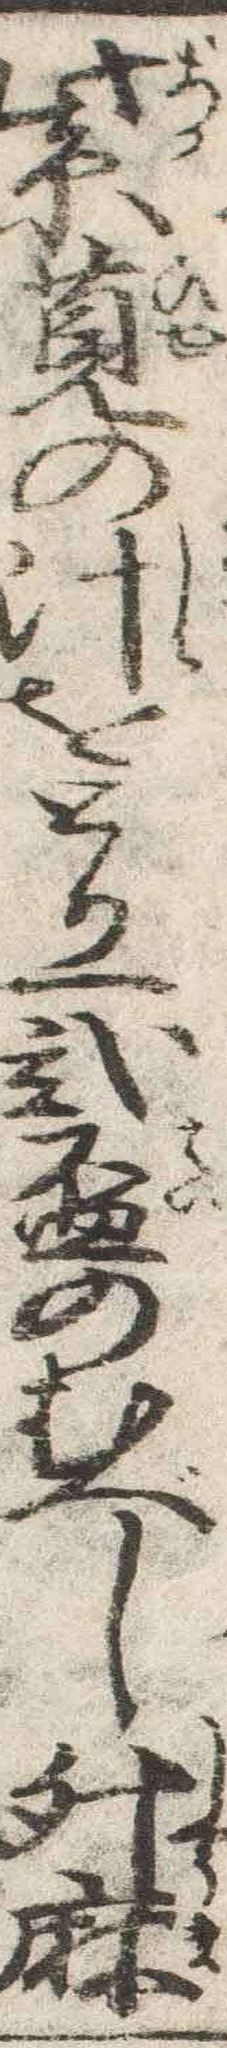紫莧の汁をとり一弐盃のむべし升麻
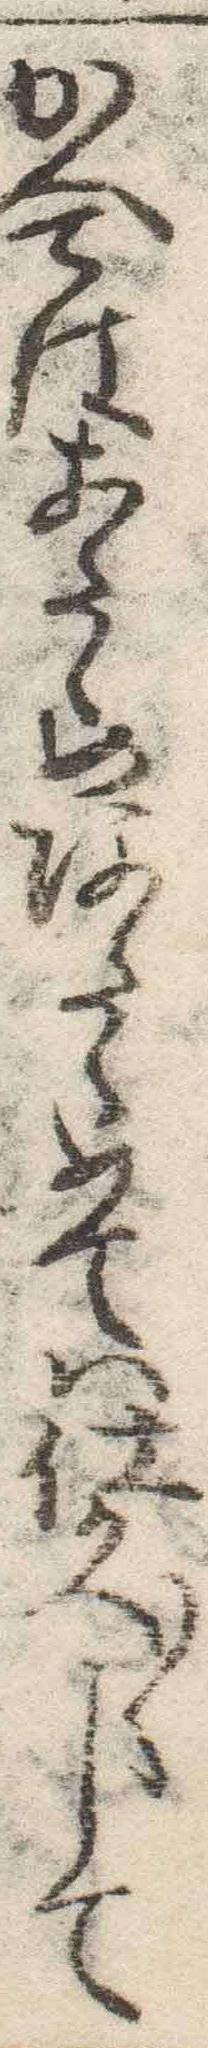かへてはあたゝめあたゝめては仕かへ〳〵して
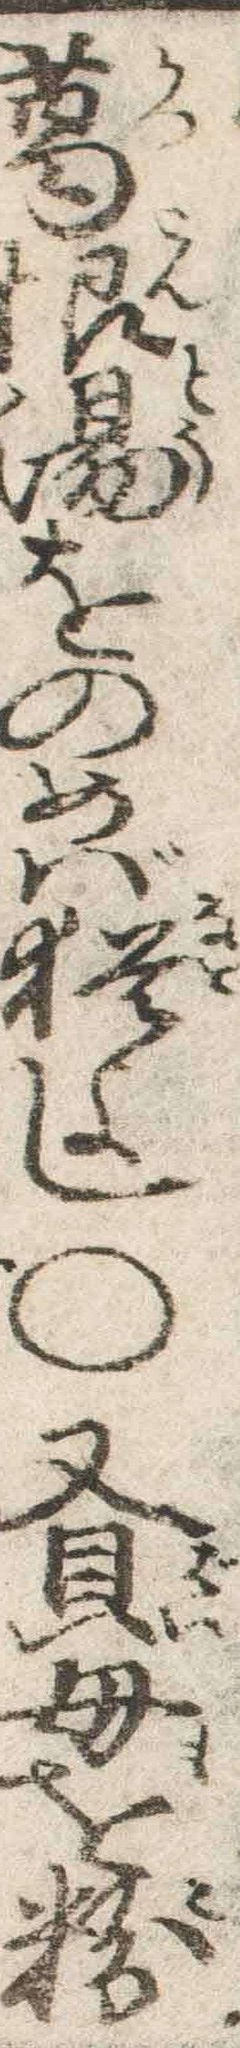葛根湯をのめば猶よし○又貝母を粉
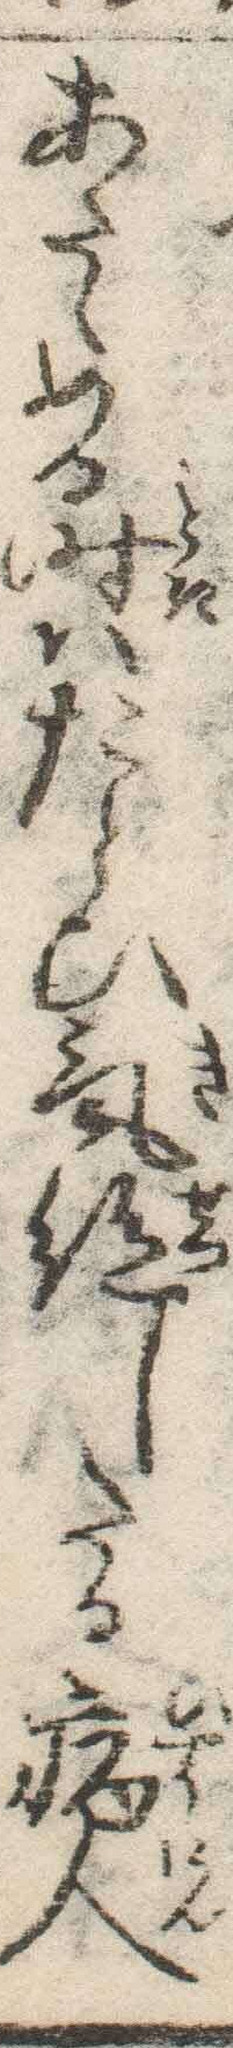あたゝめる時はたとひ気絶したる病人
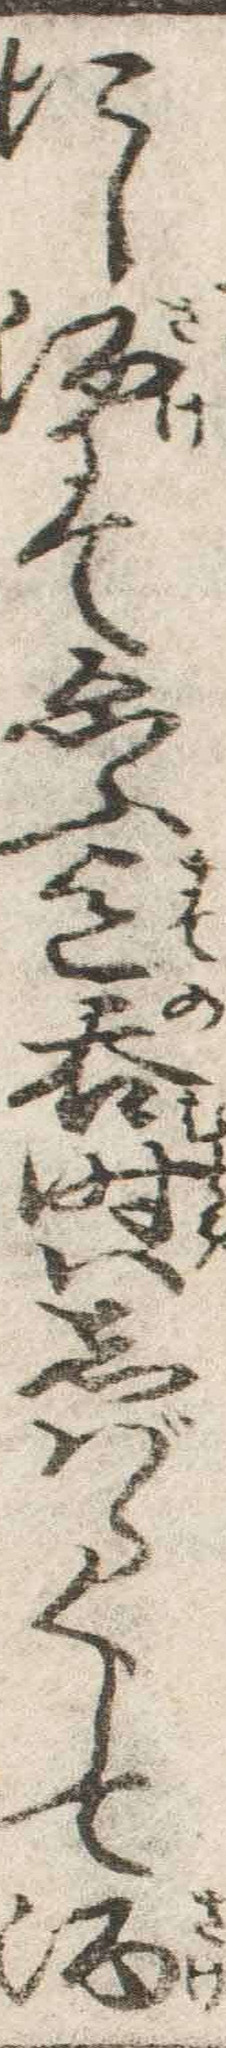にし酒にてゑふ迄呑時しばらくして酒
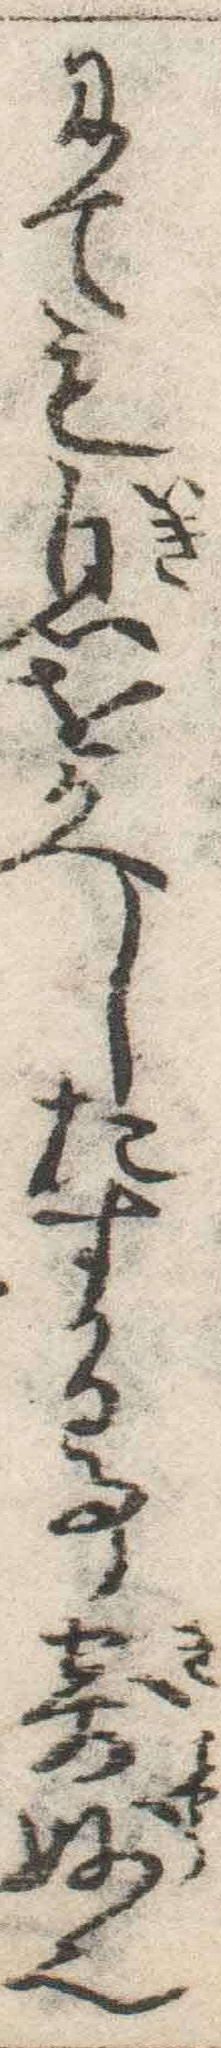にても息をかへしたすかる事奇妙也
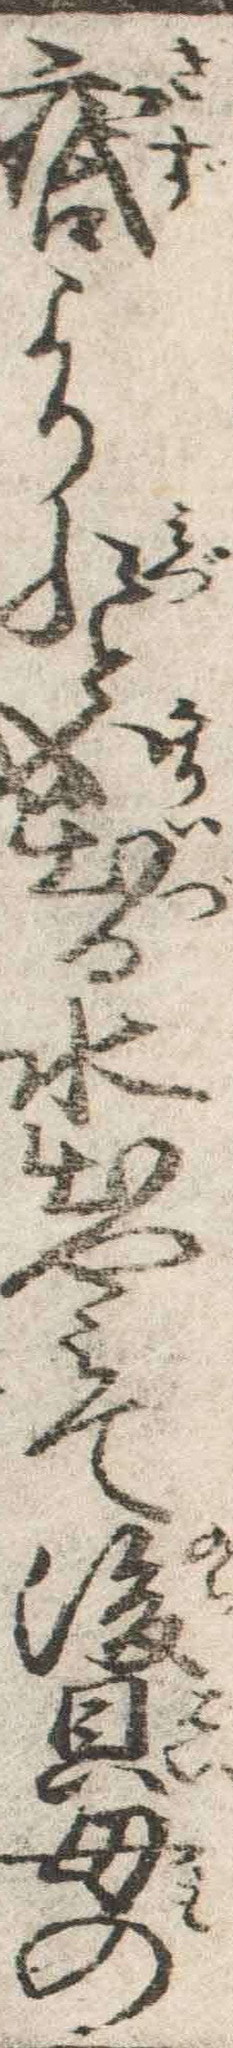疵口より水と成出る水出やみて後貝母の
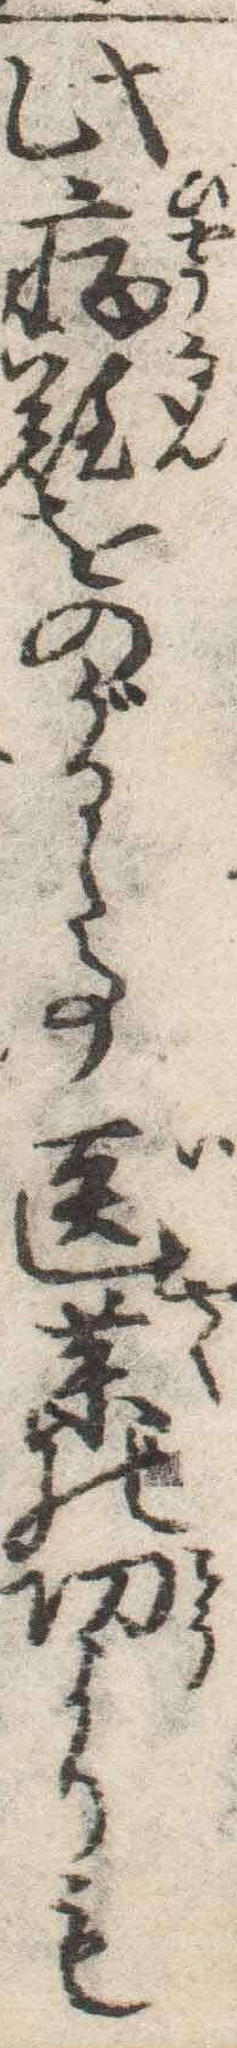此病難をのがるゝ事医薬の功よりも
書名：撫育草
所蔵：東京学芸大学附属図書館 国文学研究資料館
